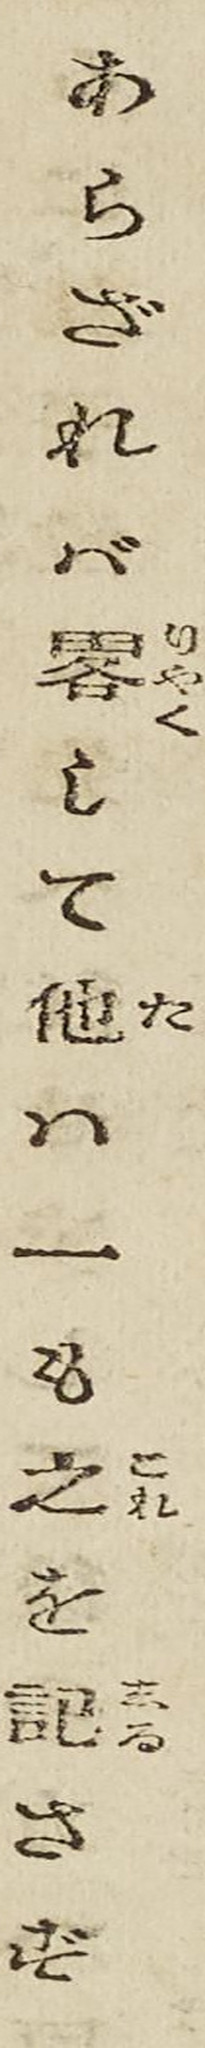あらざれば略して他は一も之を記さず
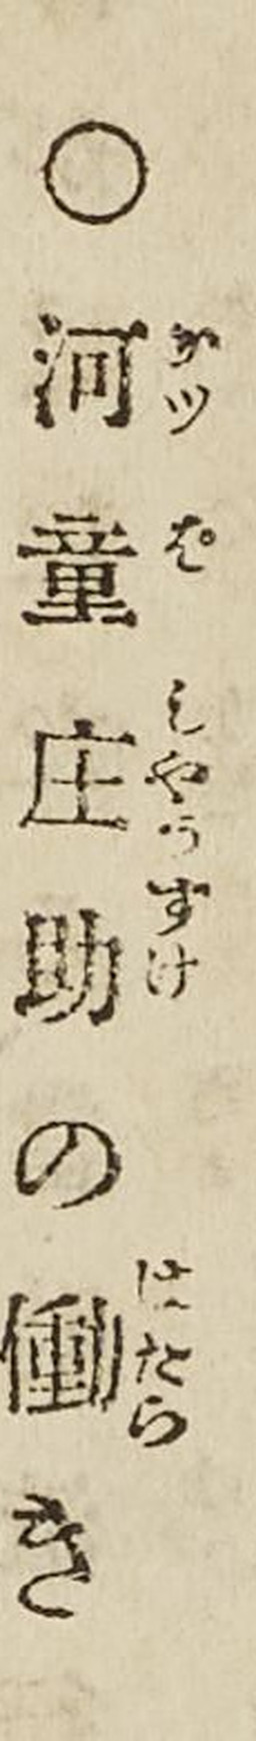○河童庄助の働き
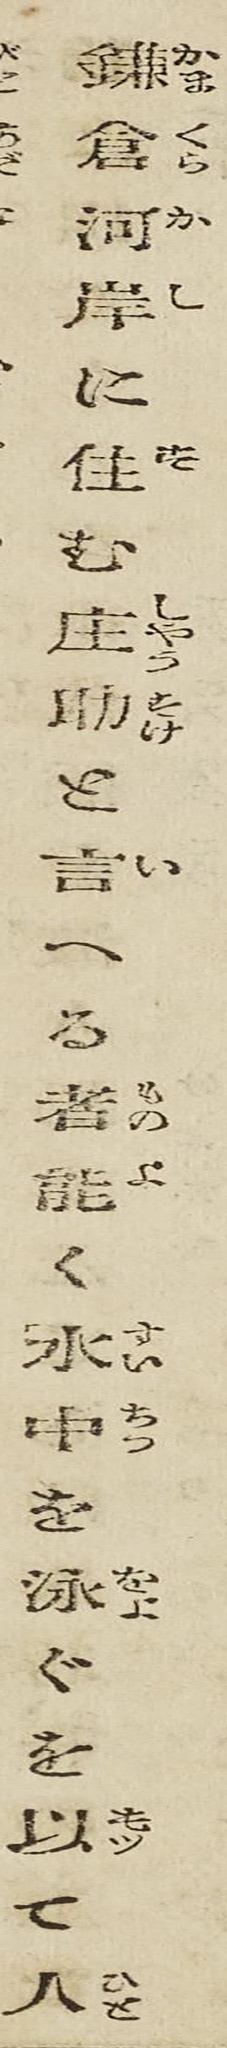鎌倉河岸に住む庄助と言へる者能く水中を泳ぐを以て人
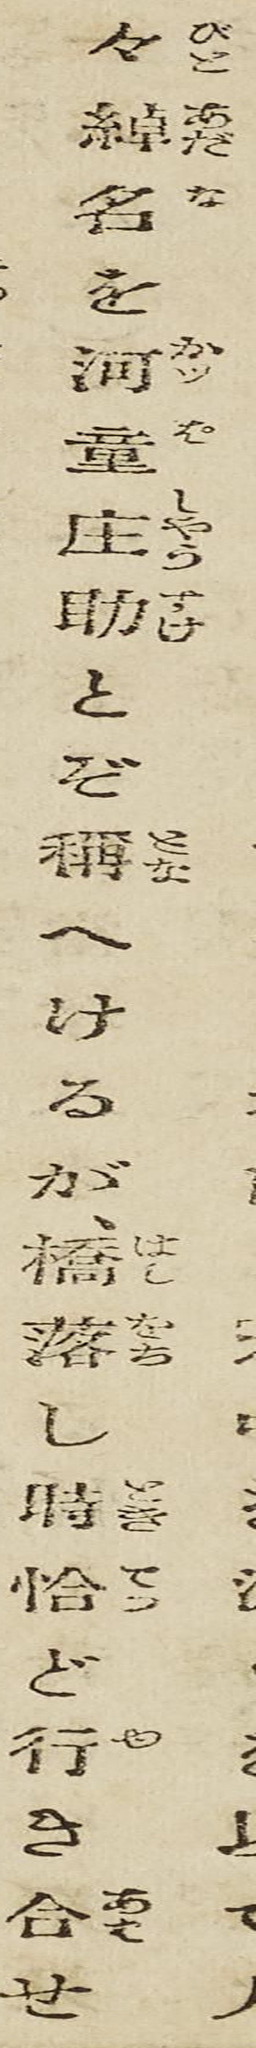々綽名を河童庄助とぞ称へけるが、橋落し時恰ど行き合せ
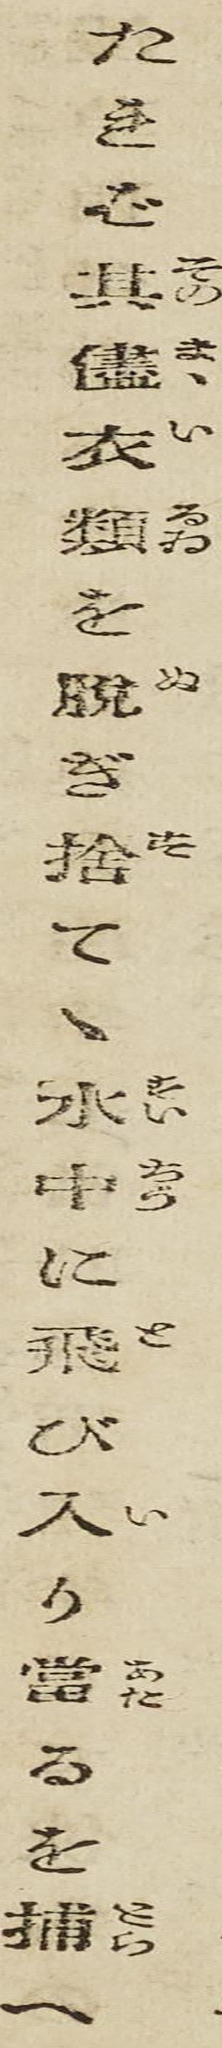たれば其侭衣類を脱ぎ捨てゝ水中に飛び入り当るを捕へ
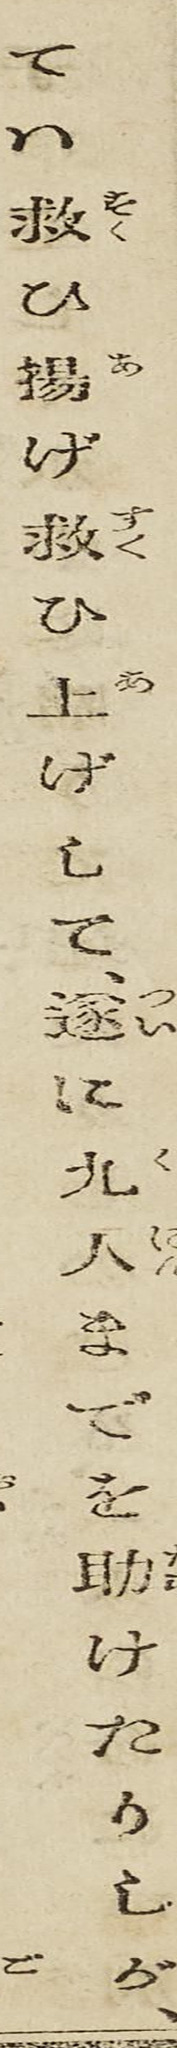ては救ひ揚げ救ひ上げして遂に九人までを助けたりしが、
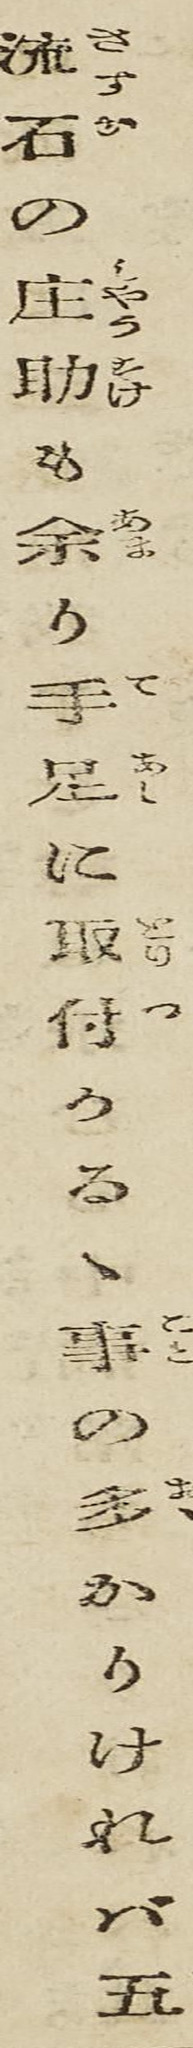流石の庄助も余り手足に取付かるゝ事の多かりければ五
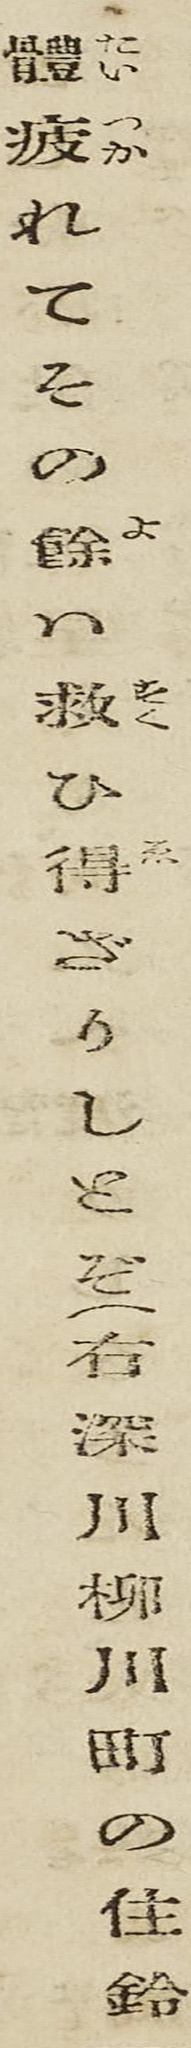体疲れてその余は救ひ得ざりしとぞ（右深川柳川町の住鈴
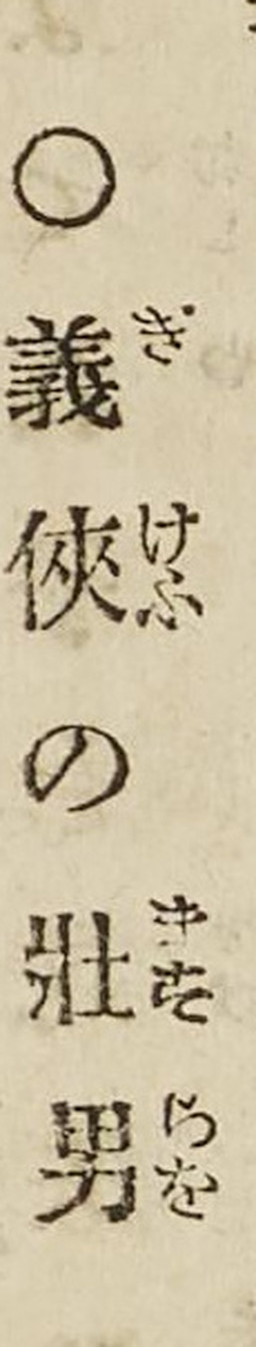○義侠の壮男
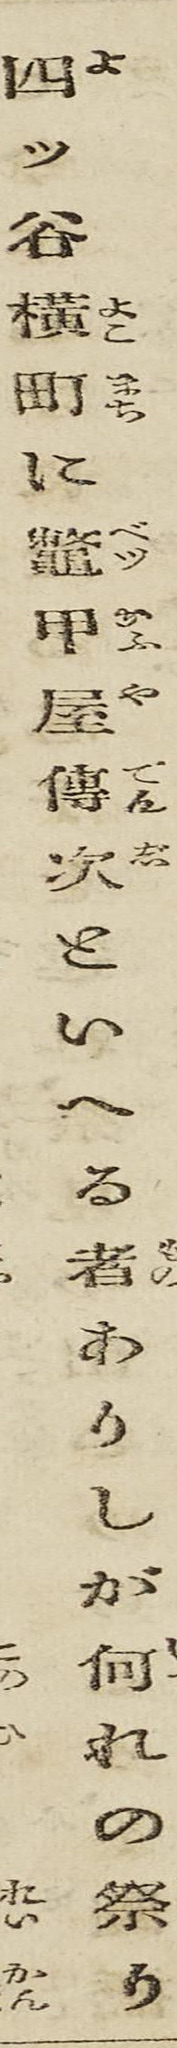四ツ谷横町に鼈甲屋傳次といへる者ありしが何れの祭り
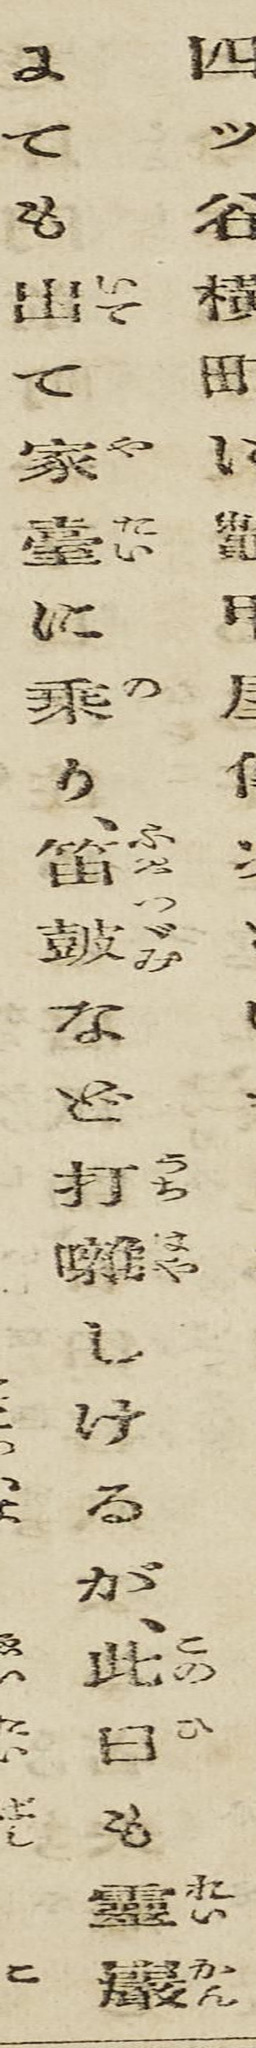にても出て家台に乗り、笛皷など打囃しけるが、此日も霊巌
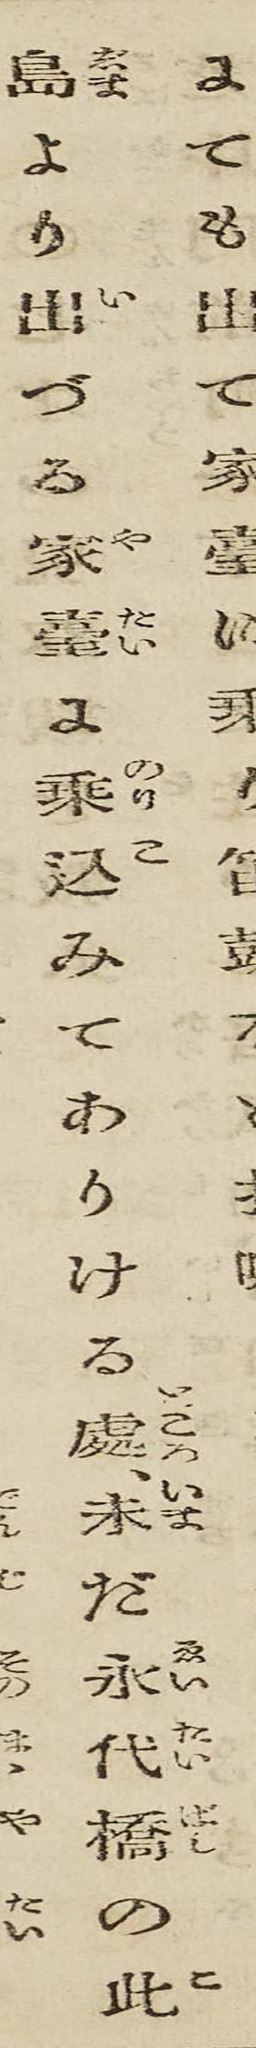島より出づる家台に乗込みてありける処、未だ永代橋の此
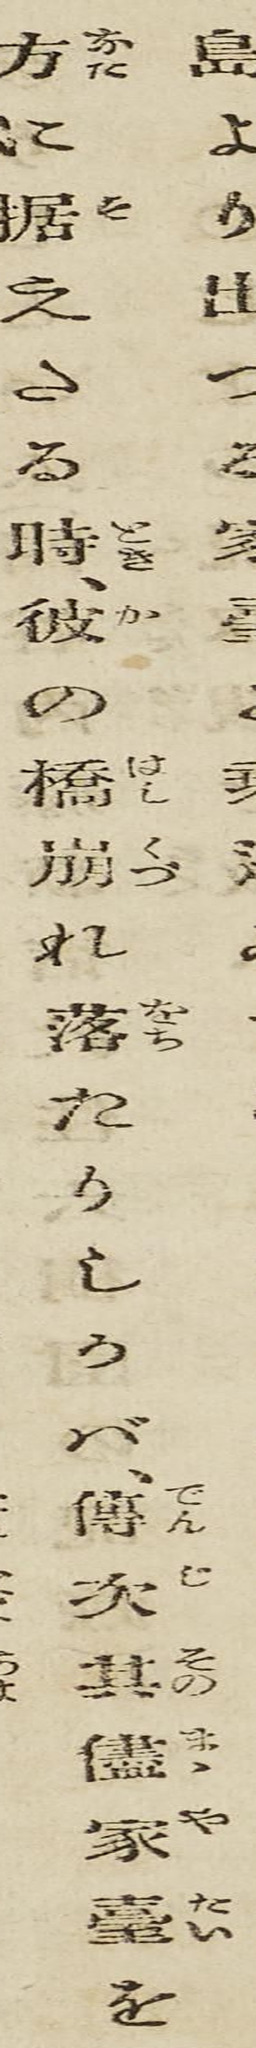方に据えたる時、彼の橋崩れ落たりしかば、傳次其侭家台を
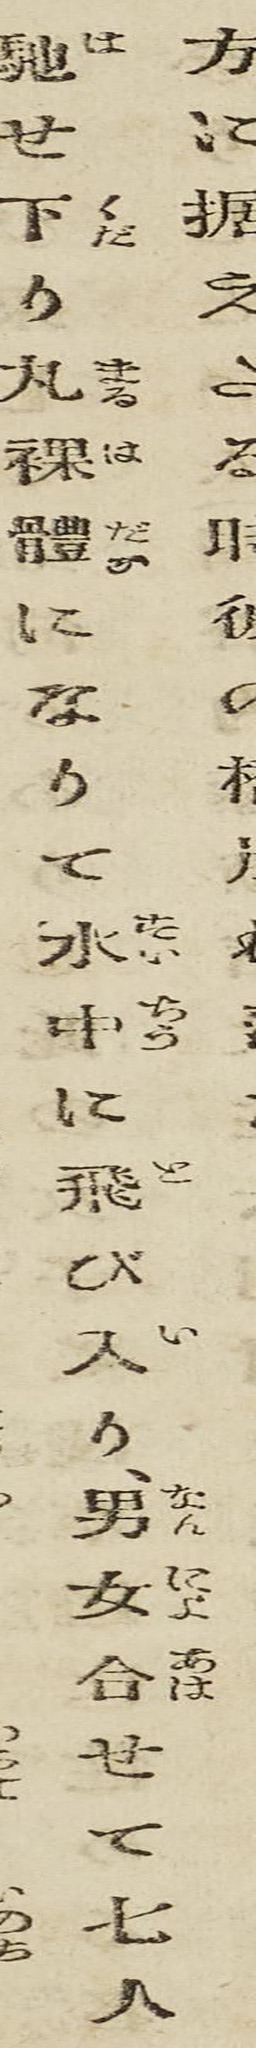馳せ下り丸裸体になりて水中に飛び入り、男女合せて七人
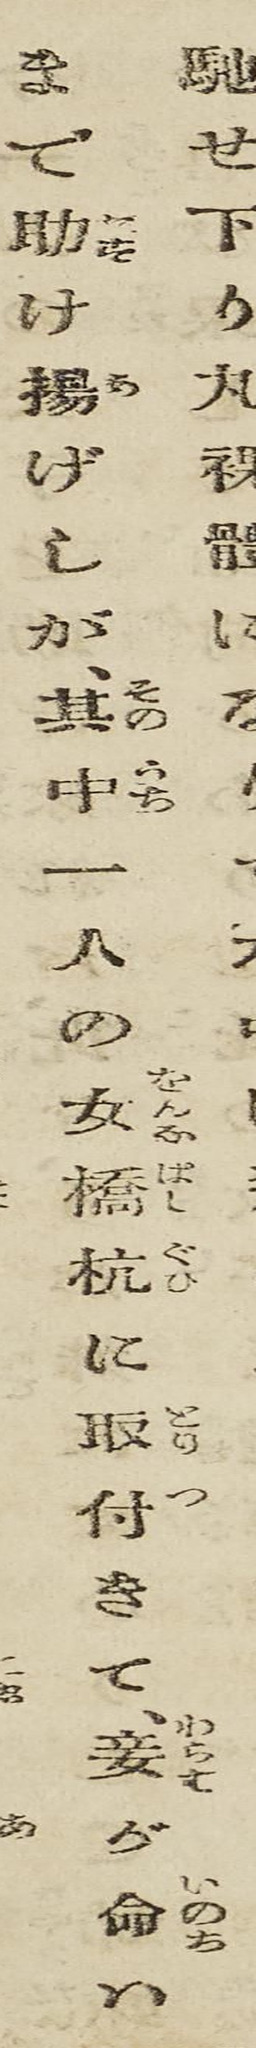まで助け揚げしが、其中一人の女橋杭に取付きて妾が命は
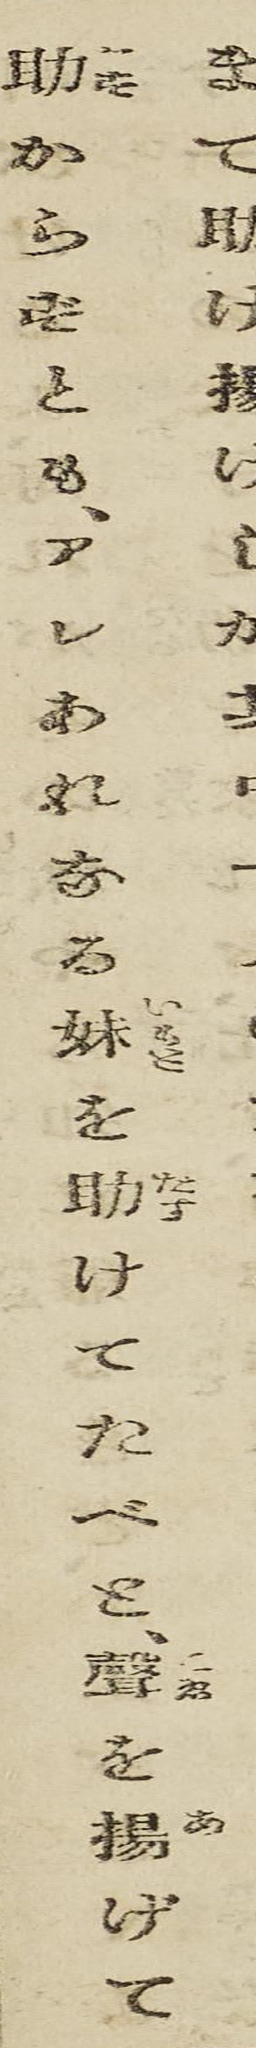助からすとも、アレあれなる妹を助けてたべと、声を挙げて
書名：永代惨話　文化の夢　全
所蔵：東京大学地震研究所図書室 Earthquake Research Institute Library, The University of Tokyo, JAPAN
